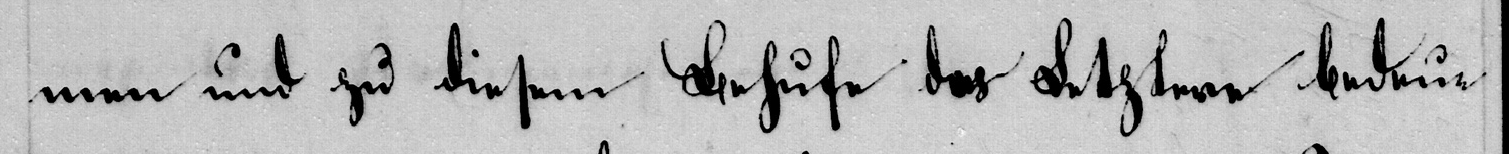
men und zu diesem Behufe das Letztere bedeu¬
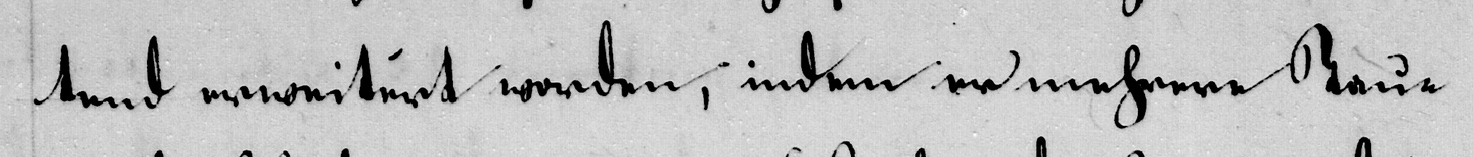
tend erweitert worden, indem er mehrere Tau¬
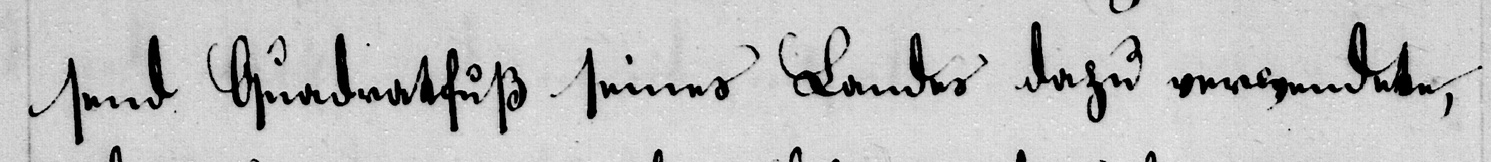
send Quadratfuß seines Landes dazu verwendete,
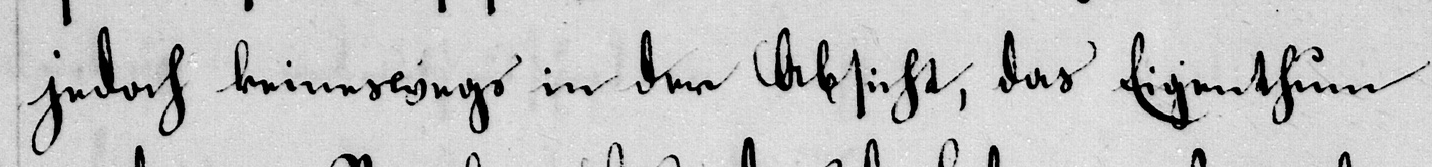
jedoch keineswegs in der Absicht, das Eigenthum
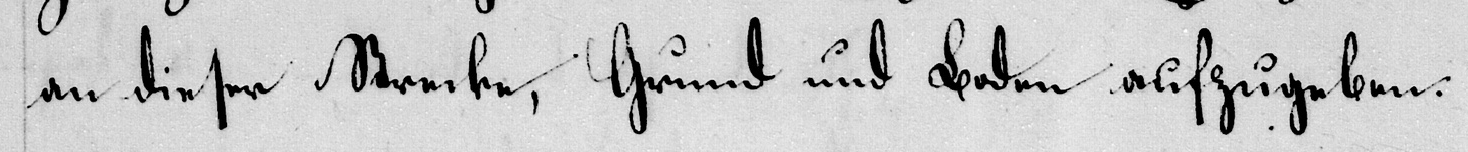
an dieser Strecke, Grund und Boden aufzugeben.
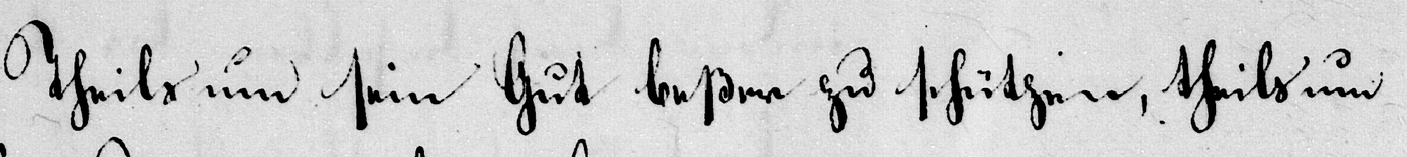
Theils um sein Gut beßer zu schützen, theils um
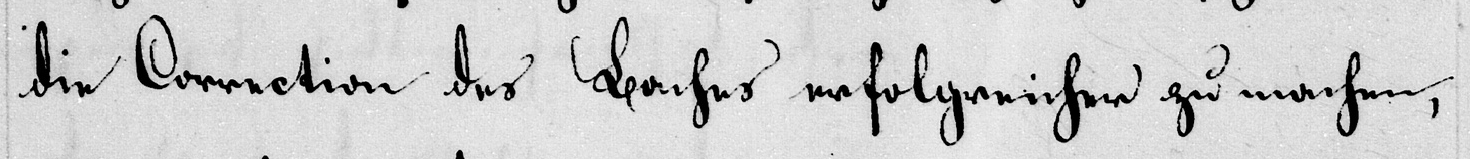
die Correction des Baches erfolgreicher zu machen,
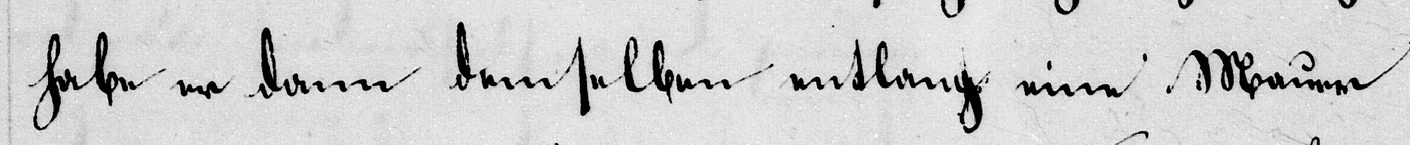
habe er dann demselben entlang eine Mauer
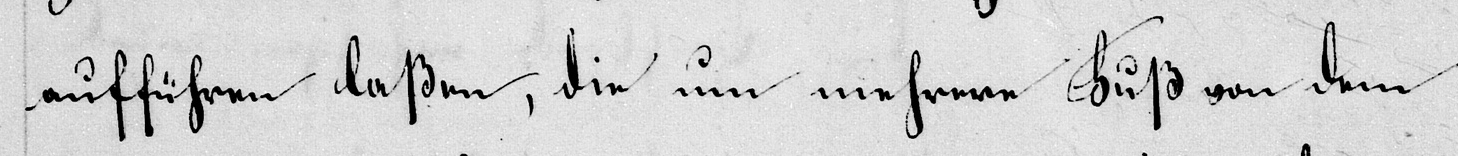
aufführen laßen, die um mehrere Fuß von dem
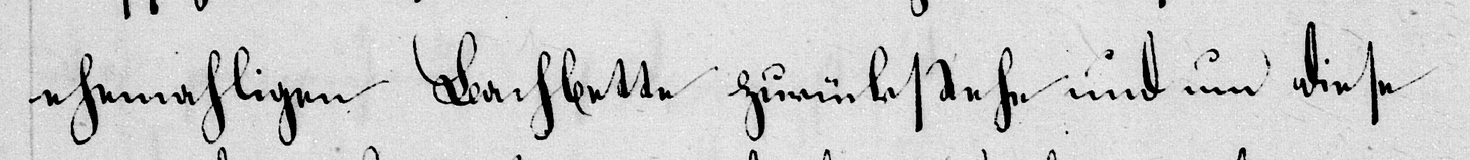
ehemahligen Bachbette zurückstehe und um diese
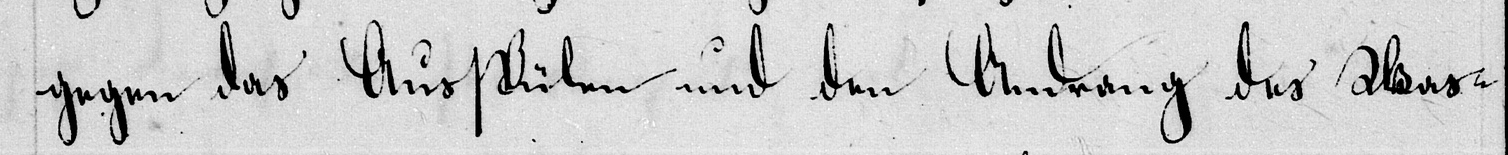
gegen das Ausspülen und den Andrang des Wa¬
